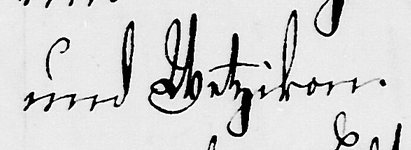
und Wetzikon.
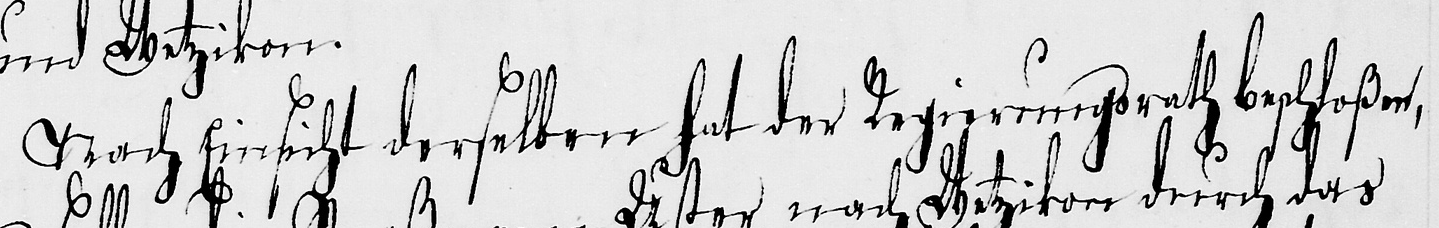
Nach Einsicht derselben hat der Regierungsrath beschloßen,
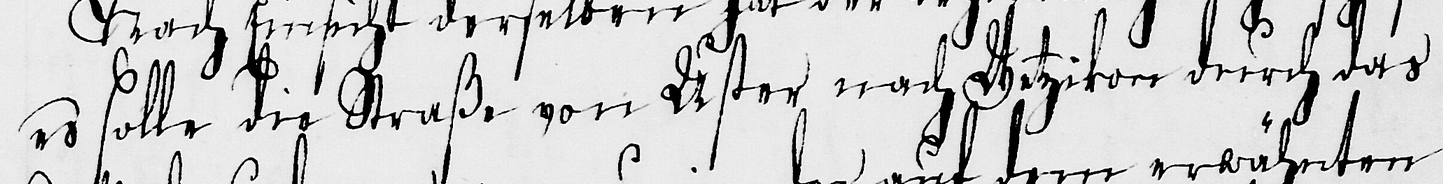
es solle die Straße von Uster nach Wetzikon durch das
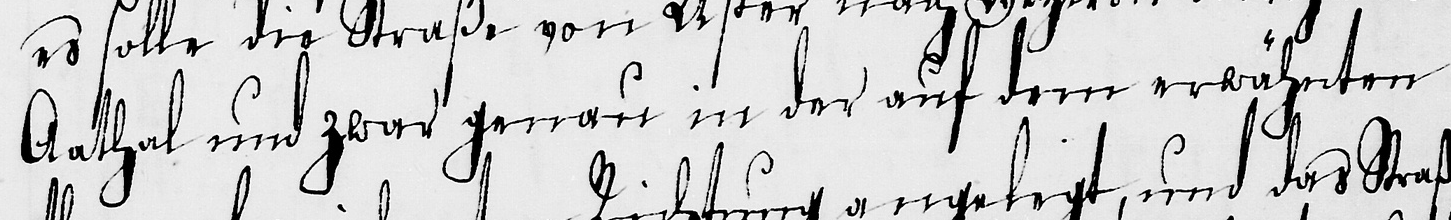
Aathal und zwar genau in der auf dem erwähnten
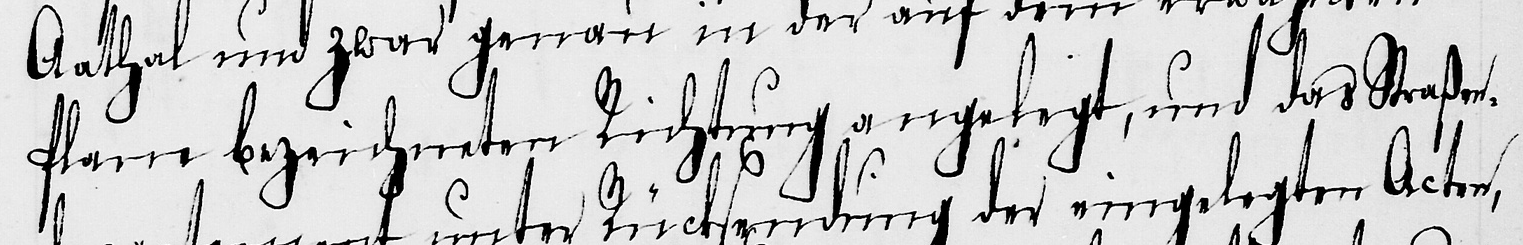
Plane bezeichneten Richtung angelegt, und das Straße¬
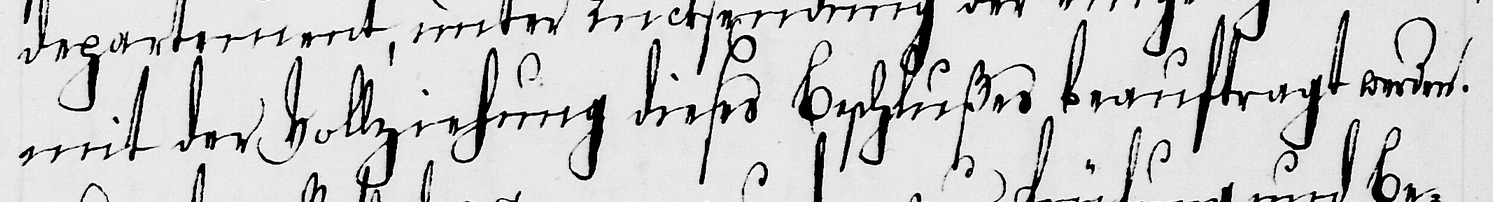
mit der Vollziehung dieses Beschlußes beauftragt wer¬
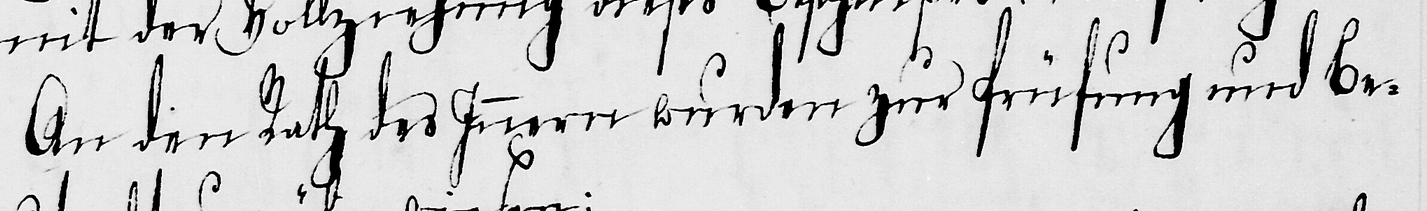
An den Rath des Innern wurden zur Prüfung und Be¬
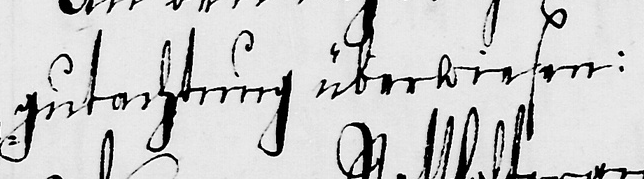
gutachtung überwiesen:
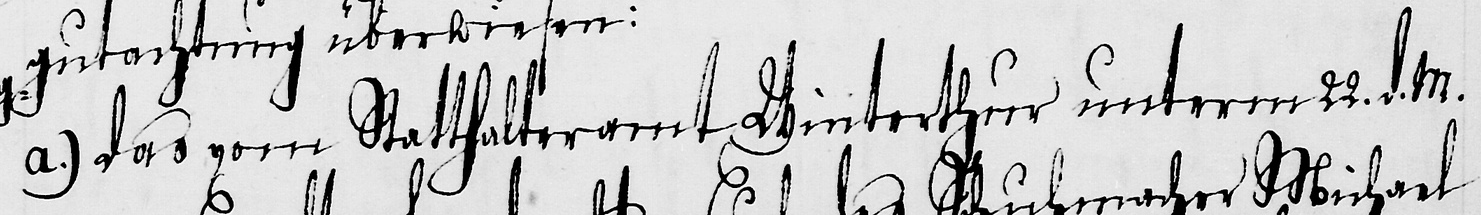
a.) das vom Statthalteramt Winterthur unterm 22. d.
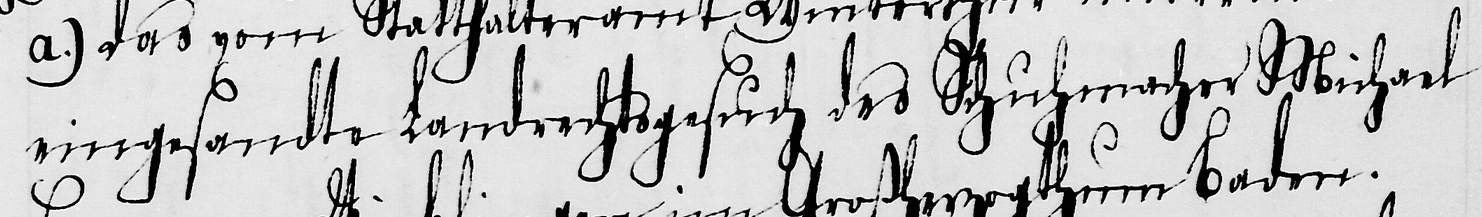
eingesandte Landrechtsgesuch des Schuhmacher Michael
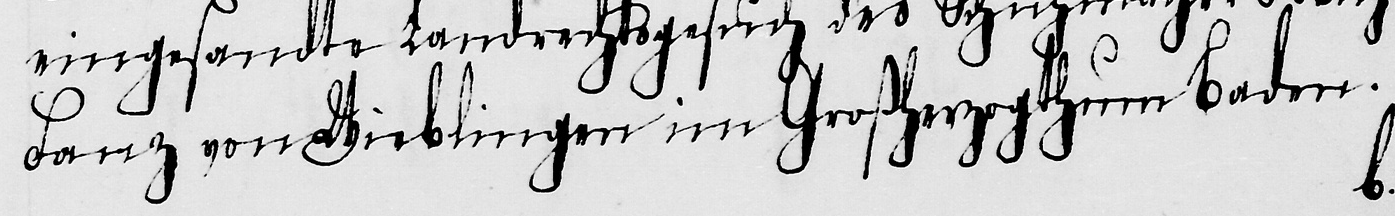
Fanz von Wieblingen im Großherzogthum Baden.
